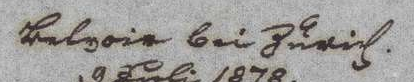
Belvoir bei Zürich
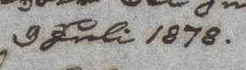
9 Juli 1878.
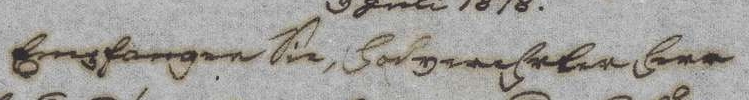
Empfangen Sie, Hochverehrter Herr
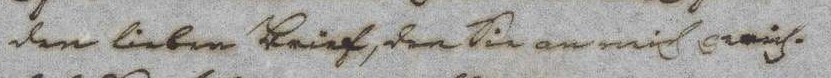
den lieben Brief, den Sie an mich gerich-
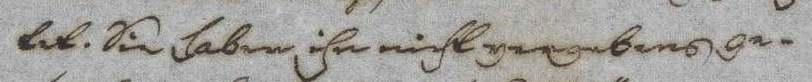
tet. Sie haben ihn nicht vergebens ge-
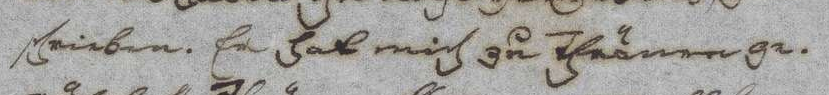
schrieben. Er hat mich zu Thränen ge-
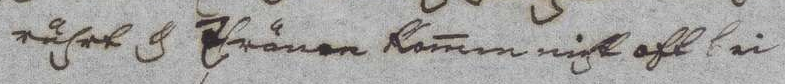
rührt & Thränen kommen nicht oft bei
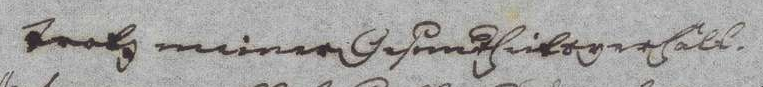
Trotz meiner Gesundheitsverhält-
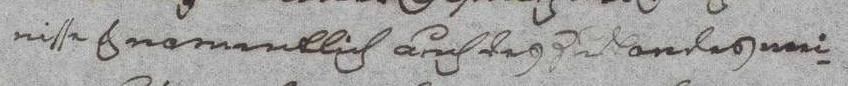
nisse & namentlich auch des Zustandes mei-
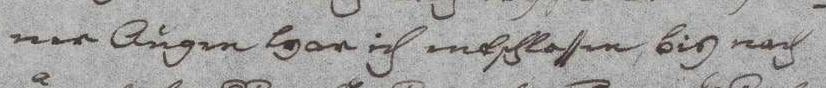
ner Augen war ich entschlossen, bis nach
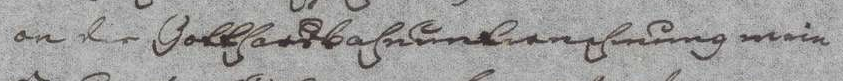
on der Gotthardbahnunternehmung mein
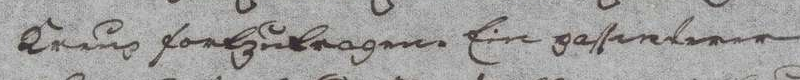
Kreuz fortzutragen. Ein passenderer
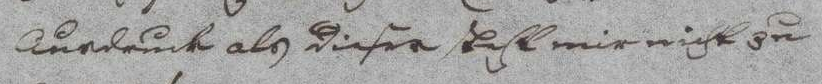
Ausdruck als dieser steht mir nicht zu
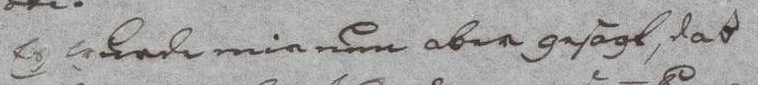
Es wurde mir nun aber gesagt, daß
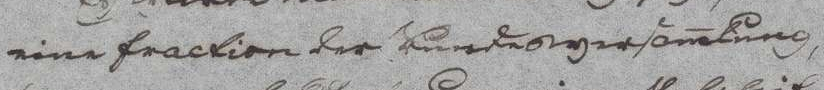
eine Fraction der Bundesversammlung,
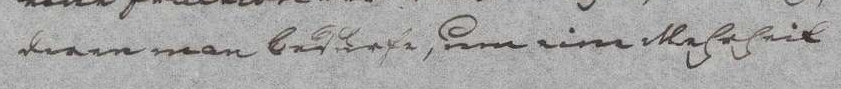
derer man bedürfe, um eine Mehrheit
